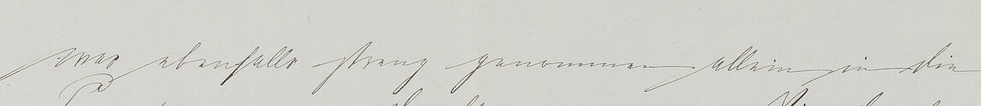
was ebenfalls streng genommen allein in die
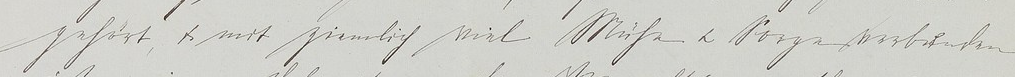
gehört, & mit ziemlich viel Mühe & Sorge verbunden
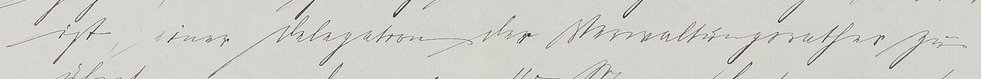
ist, einer Delegation des Verwaltungsrathes zu
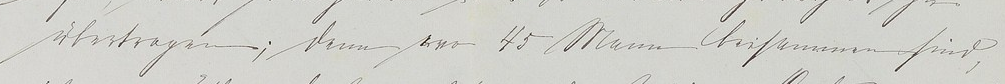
übertragen; denn wo 45 Mann beisammen sind,
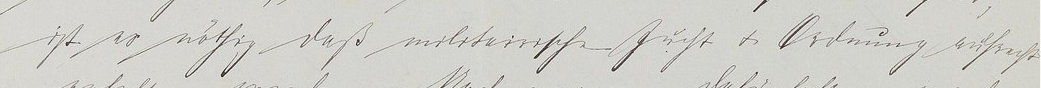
ist es nöthig daß militairische Zucht & Ordnung aufrecht
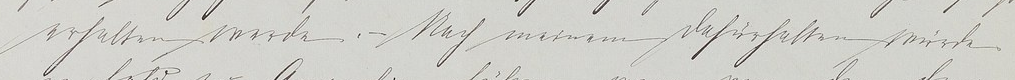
erhalten werde. – Nach meinem Dafürhalten würde
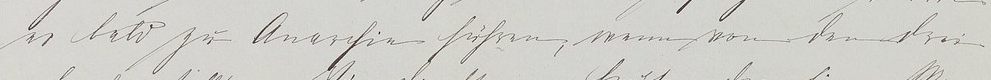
es bald zu Anarchie führen, wenn von den drei
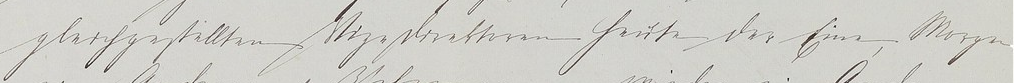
gleichgestellten Vize Direktoren heute der Eine, Morgen
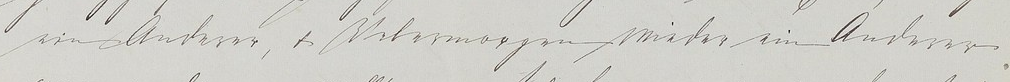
ein Anderer, & Uebermorgen wieder ein Anderer
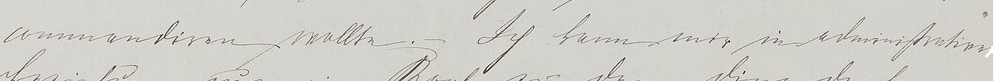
commandiren wollte. – Ich kann mir in administrativer
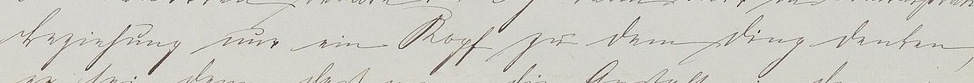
Beziehung nur ein Kopf zu dem Ding denken;
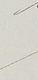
–
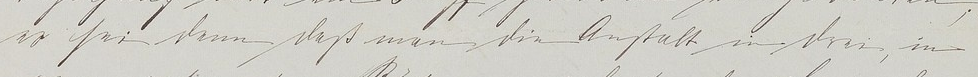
es sei denn daß man die Anstalt in drei, in
